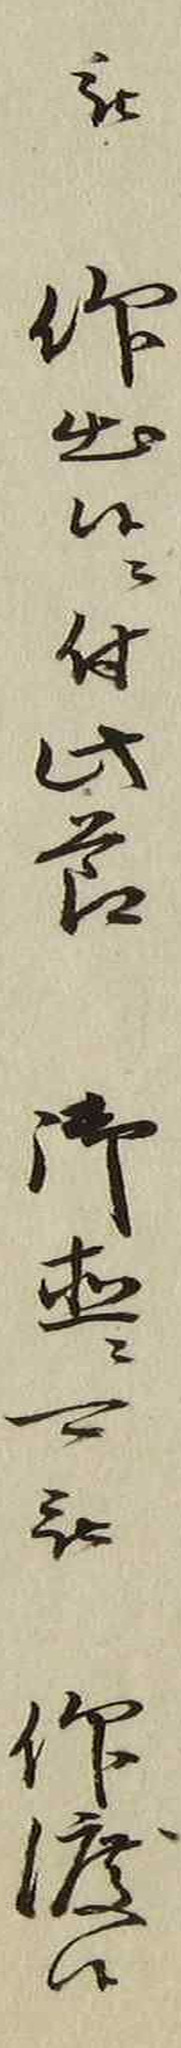被仰出候に付此節御直に可被仰渡候
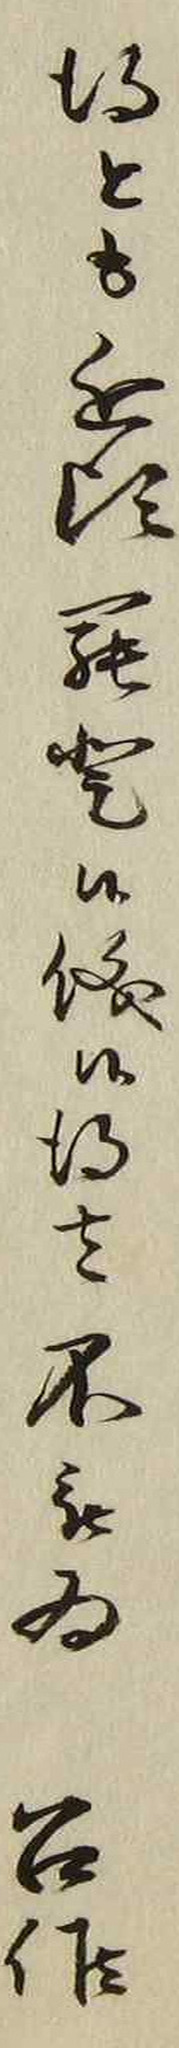得とも近頃罷登候儀侯得は不被為召候
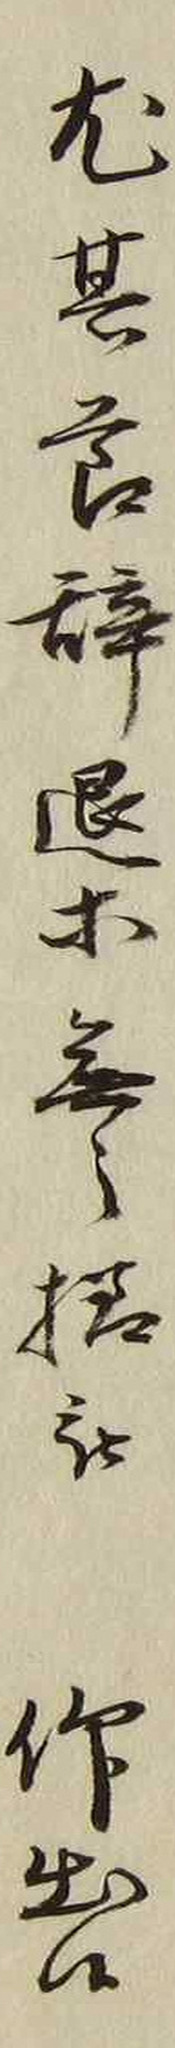尤其節辞退等無之様被仰出候
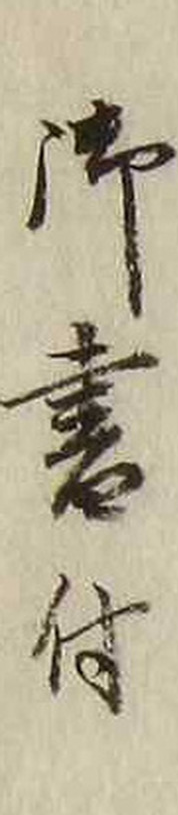御書付
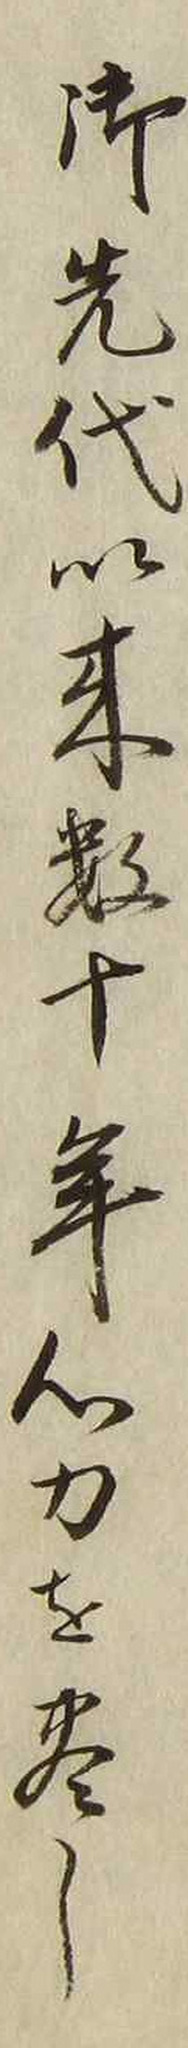御先代以来数十年心力を尽し

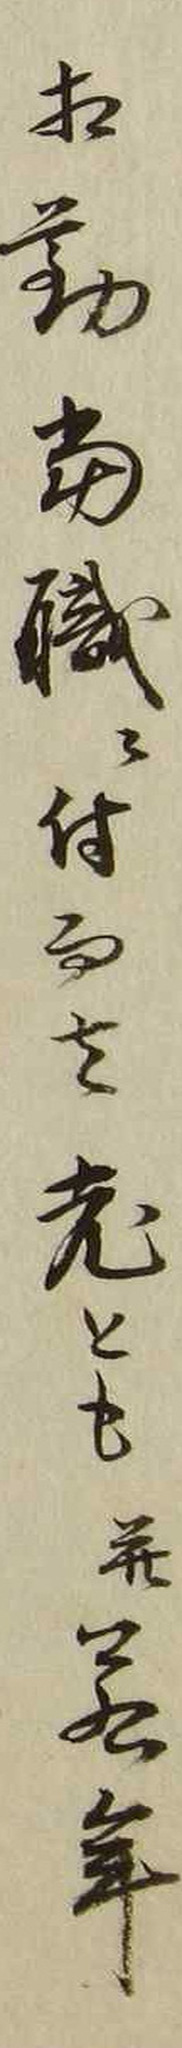相勤当職に付而は老とも并若年
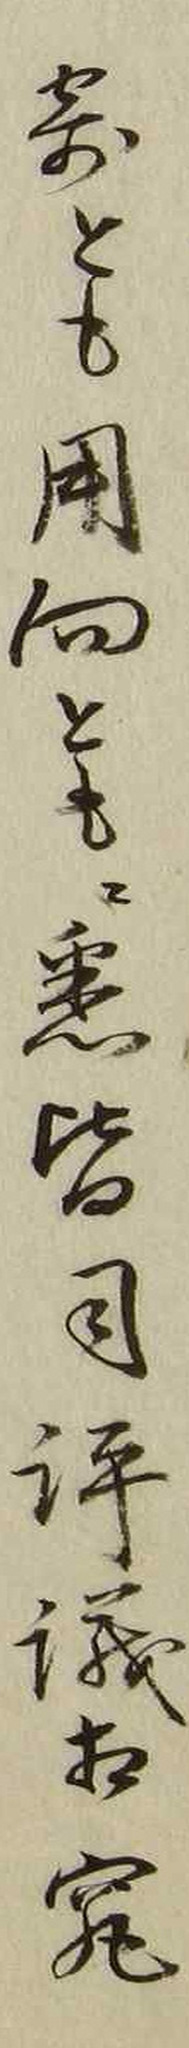寄とも用向ともに悉皆司評議相究
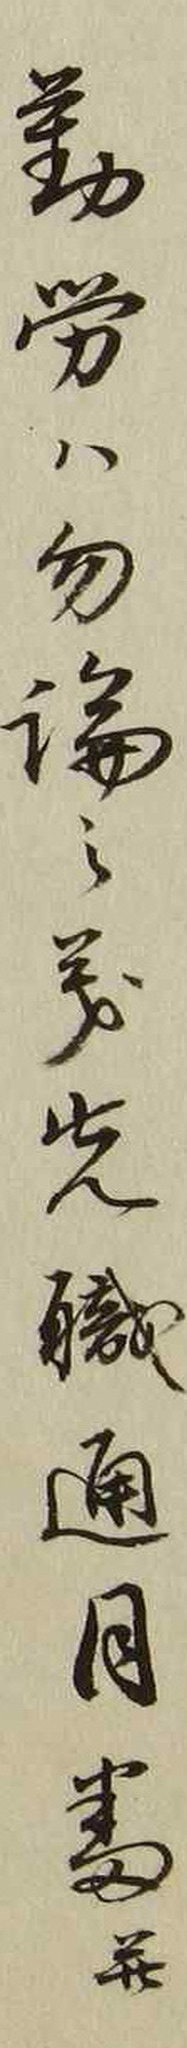勤労は勿論之義先職通月番并
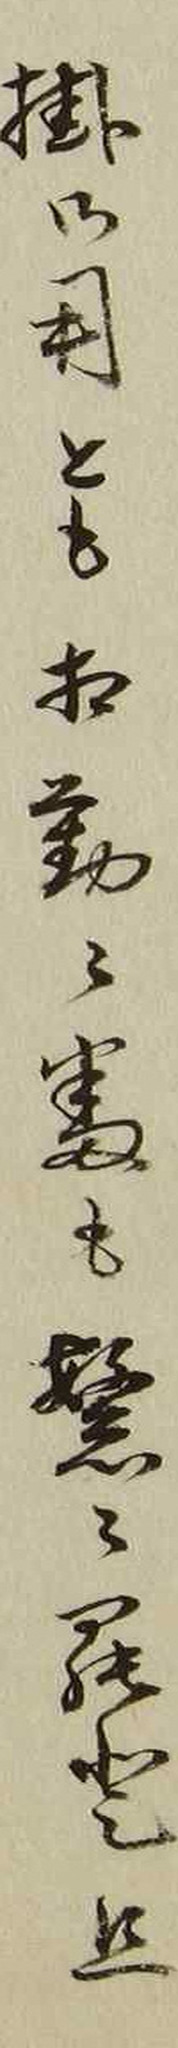掛御用とも相勤々番も繁々罷登且
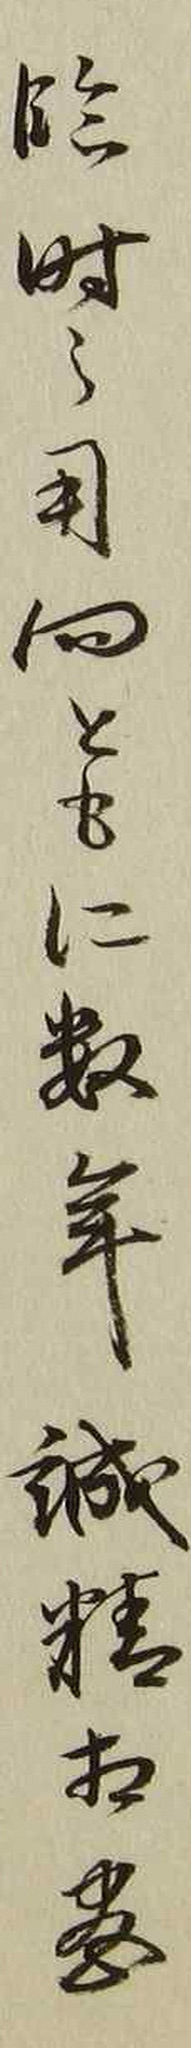臨時之用向ともに数年誠精相尽
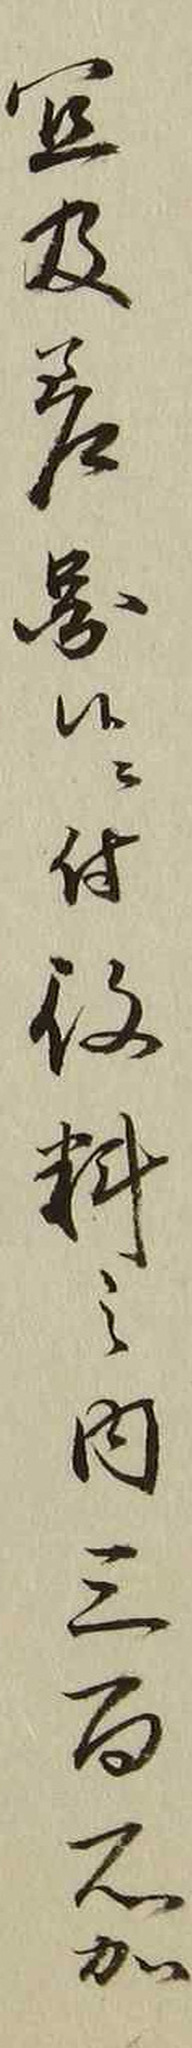宜及指図候に付役料之内三百石加
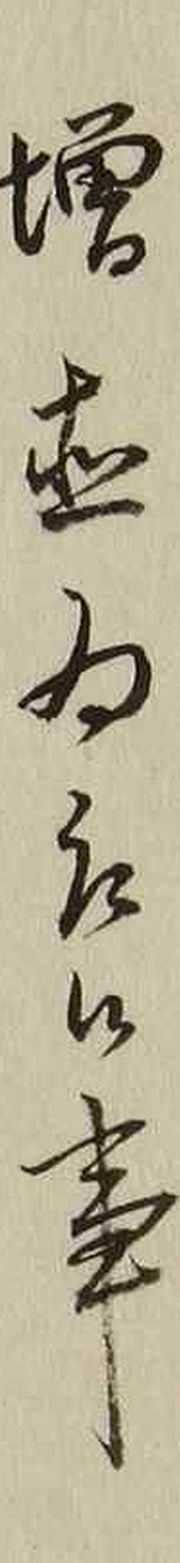増直為取候事
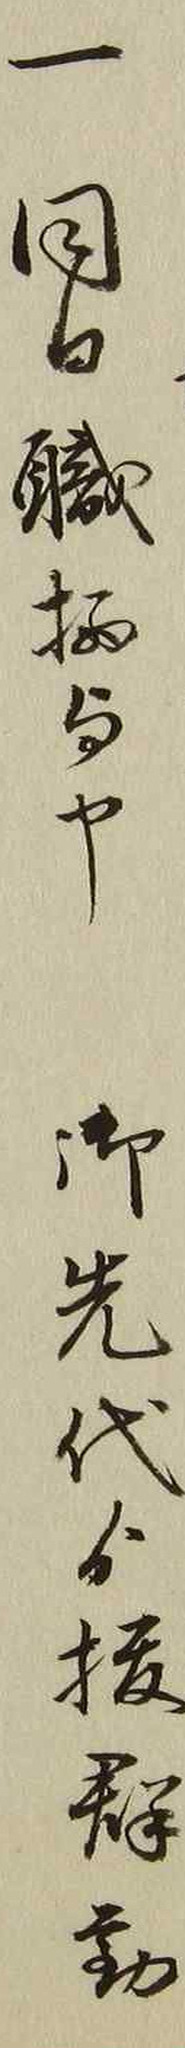一同日職柄と申御先代ゟ抜群勤
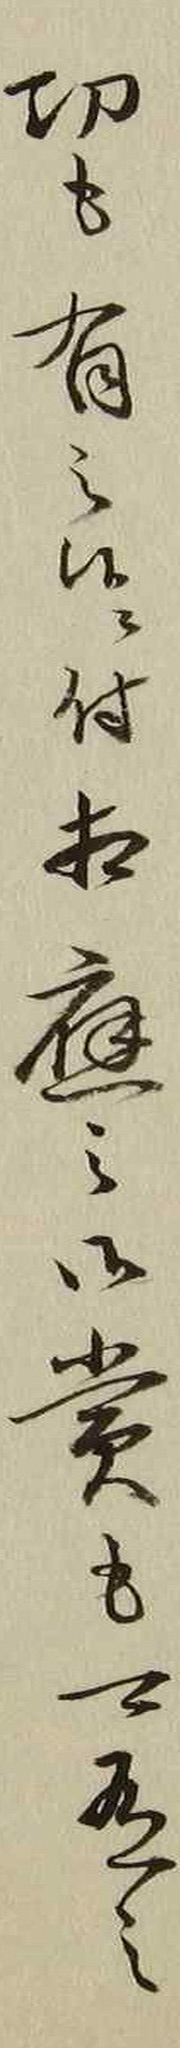功も有之候に付相応之御賞も可有之
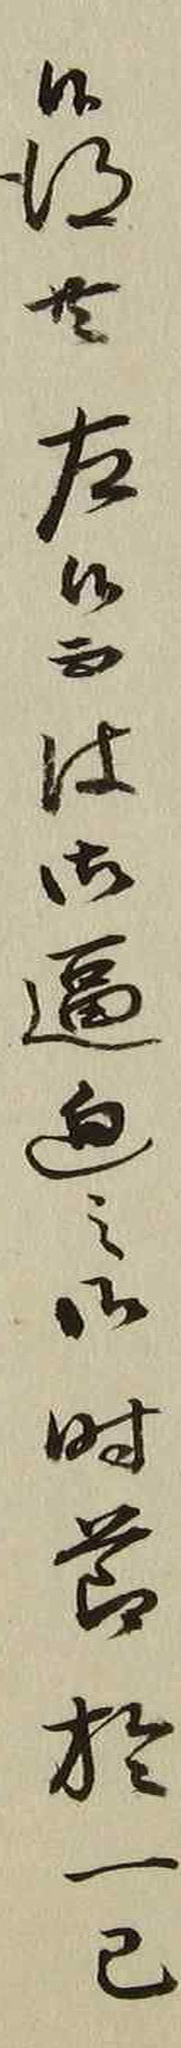候得共左候而は御逼迫之御時節於一己
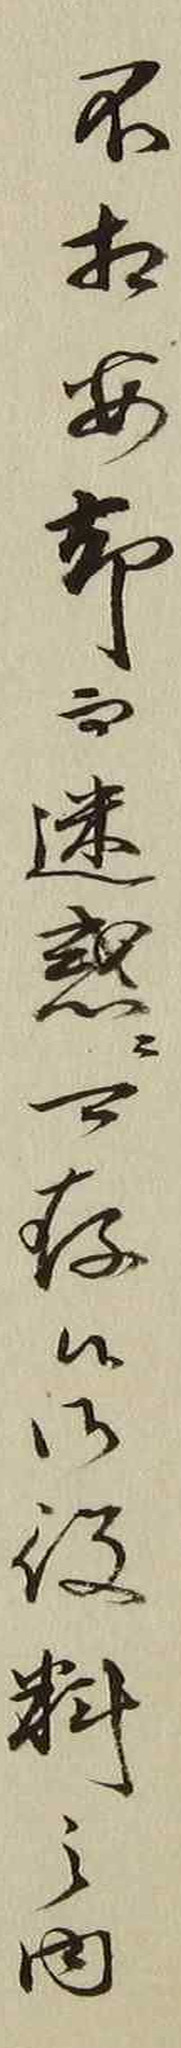不相安却而迷惑に可存候御役料之内
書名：諸士系譜　巻之125　た之部1
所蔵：会津若松市立会津図書館
